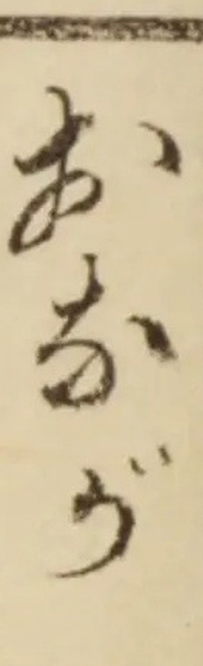おなが
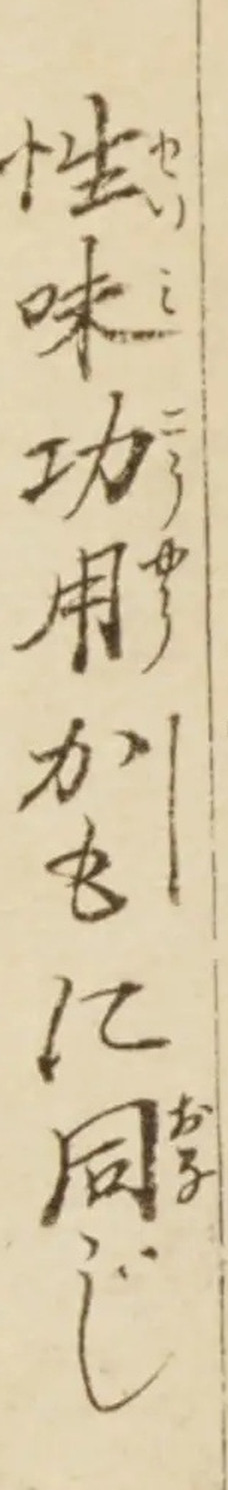性味功用かもに同じ
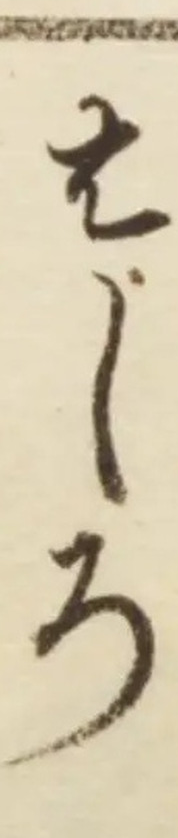はしろ

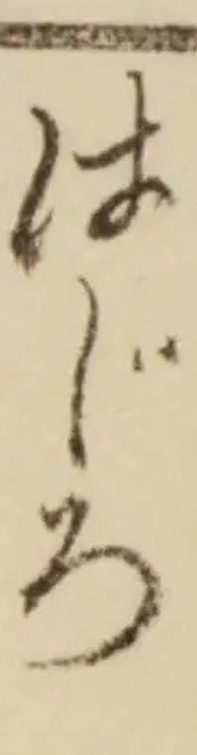はじろ
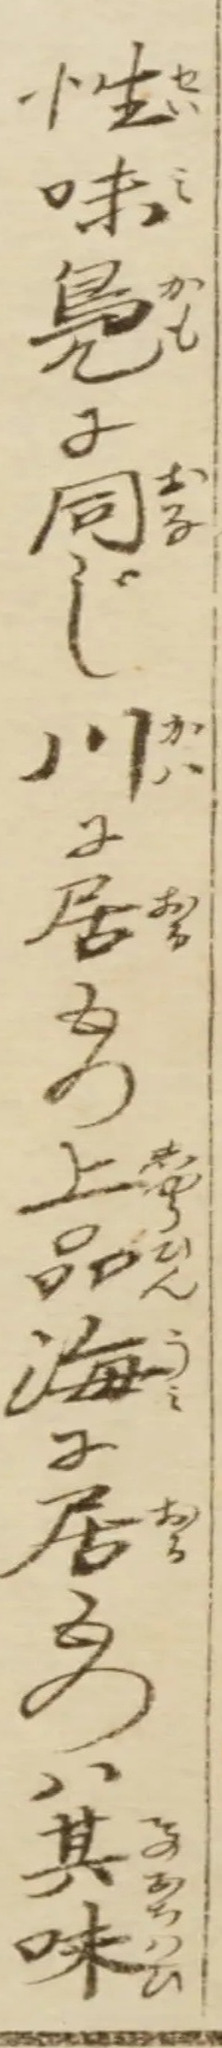性味鳧に同じ川に居もの上品海に居ものは其味
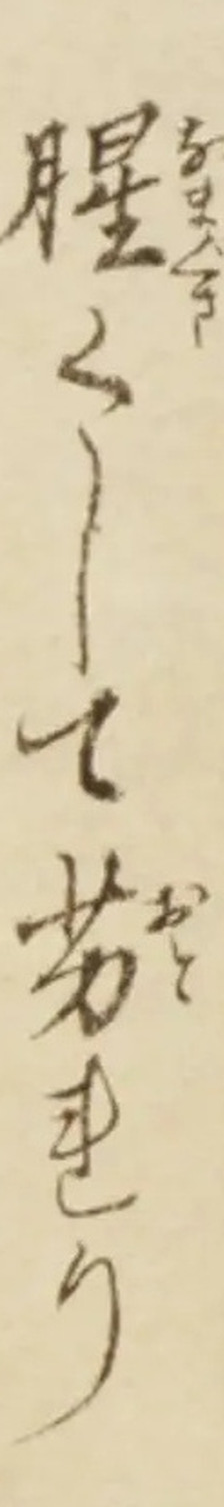腥くして劣れり
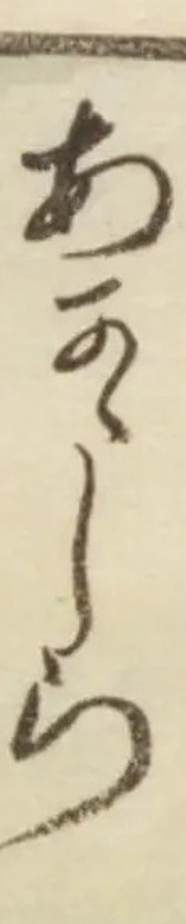あかゝしら

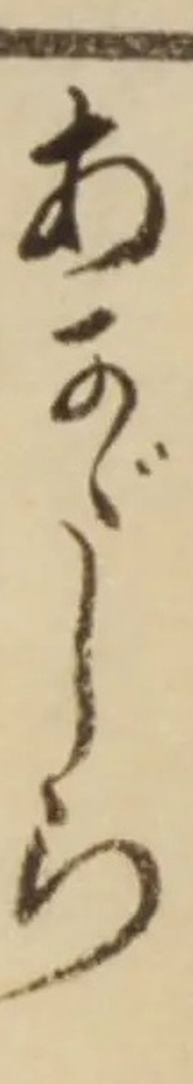あかゞしら
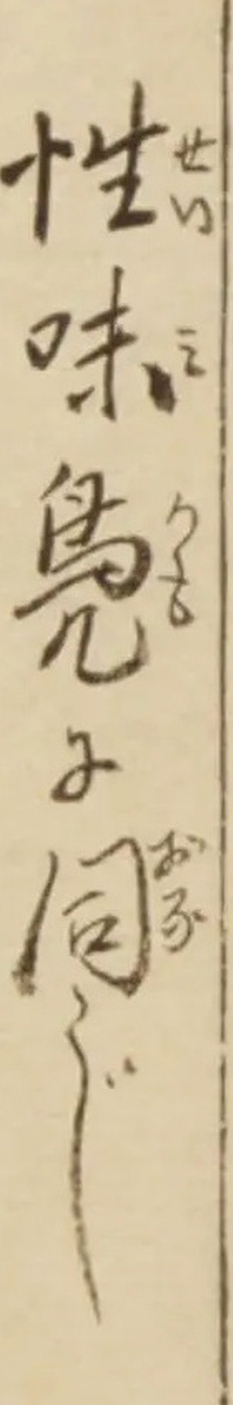性味鳧に同じ
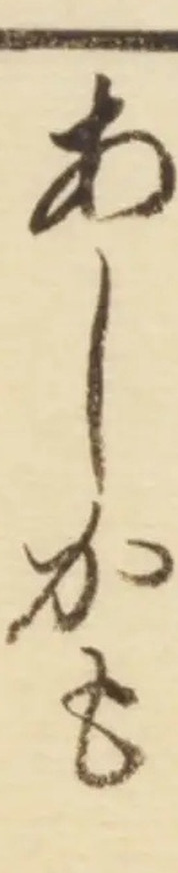あしかも

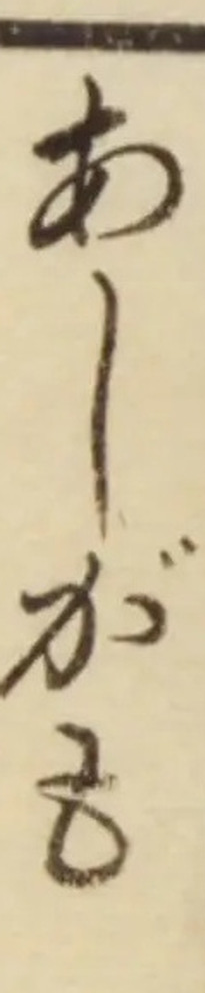あしがも
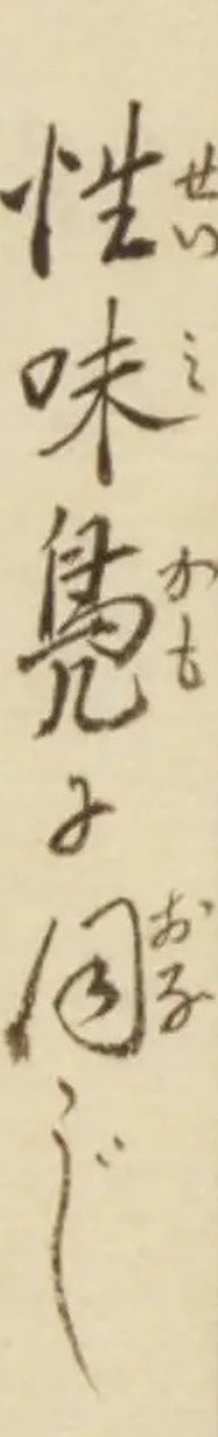性味鳧に同じ
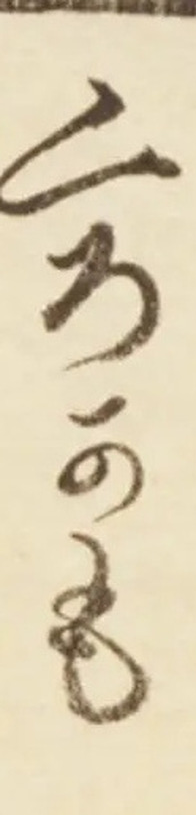くろかも

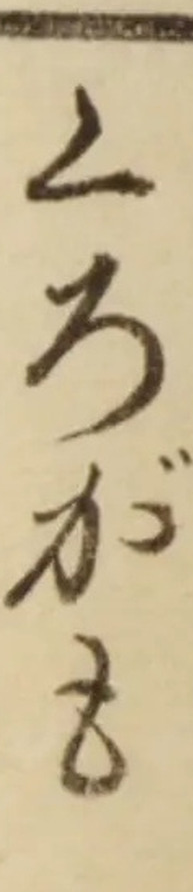くろがも
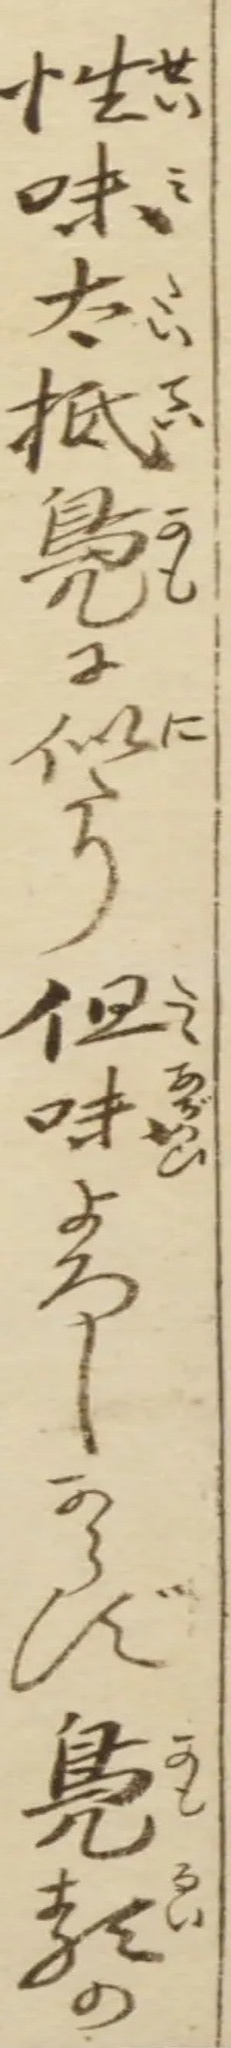性味太抵鳧に似たり但味よろしからず鳧類の
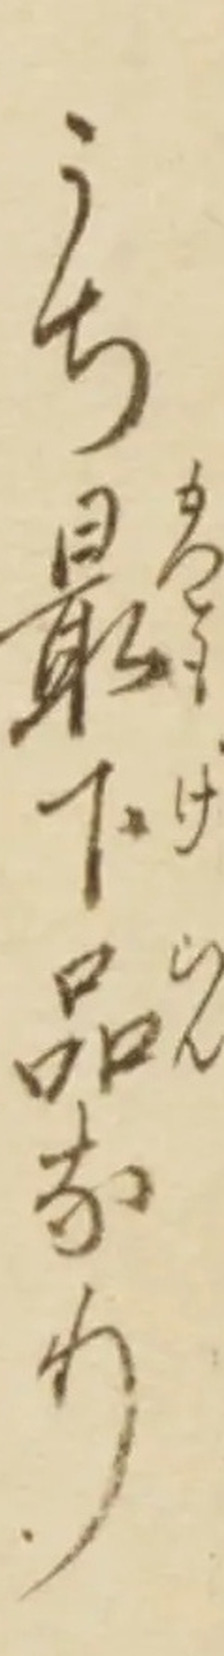うち最下品なり
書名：華鳥譜
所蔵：国立国会図書館 National Diet Library, JAPAN
